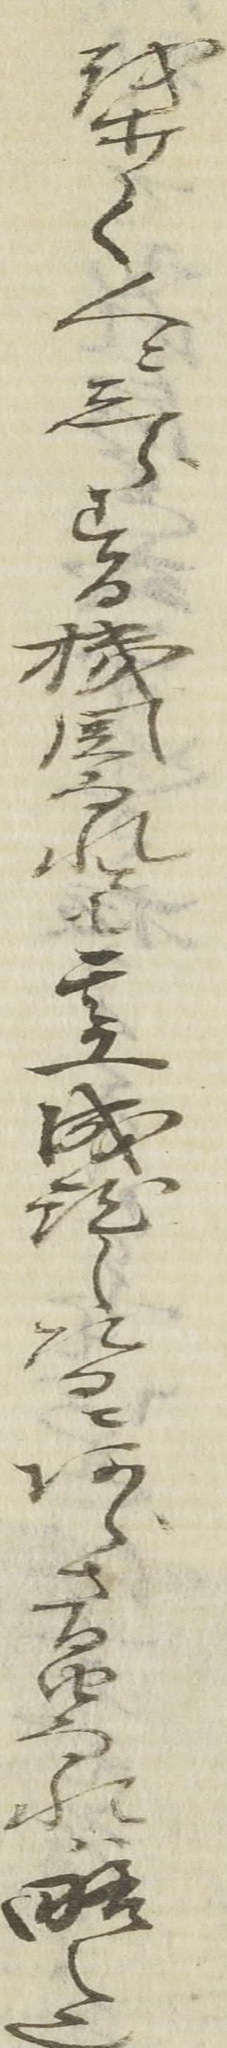を打て人ニしらする機関なれとも其工成就したるニあらさる由なれハ略之也
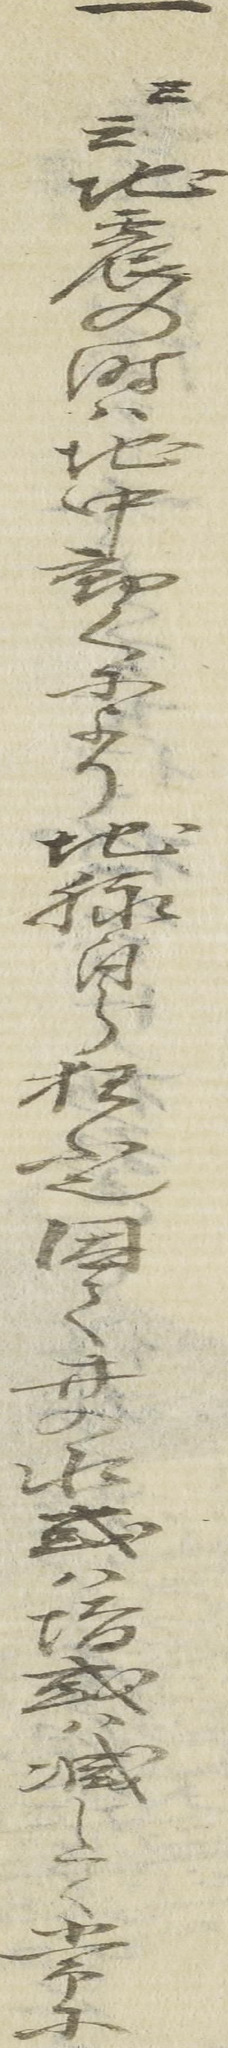一云云地震の時ハ地中動くにより地脈自ら狂ふ也因て井の水或ハ増或ハ減して常に
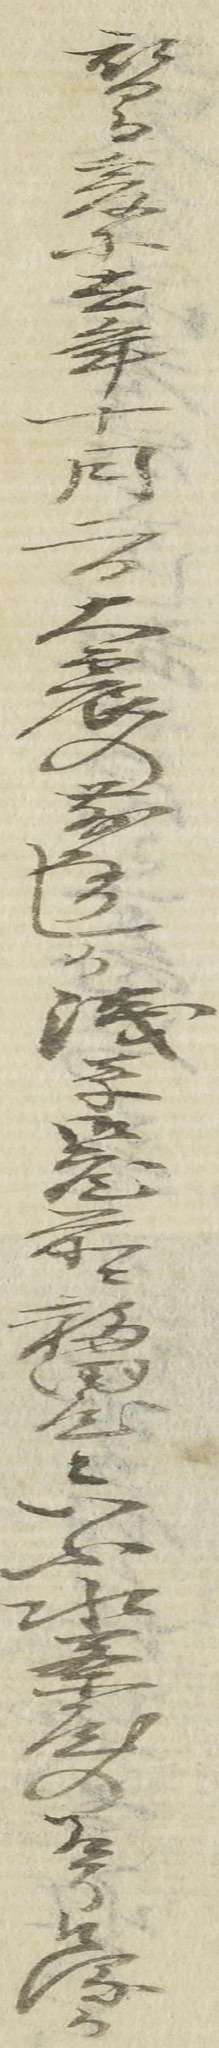替而爰に去年十月二日大震の前なりしか浅草御蔵前ニ福田屋といふ水茶屋の有りケるか
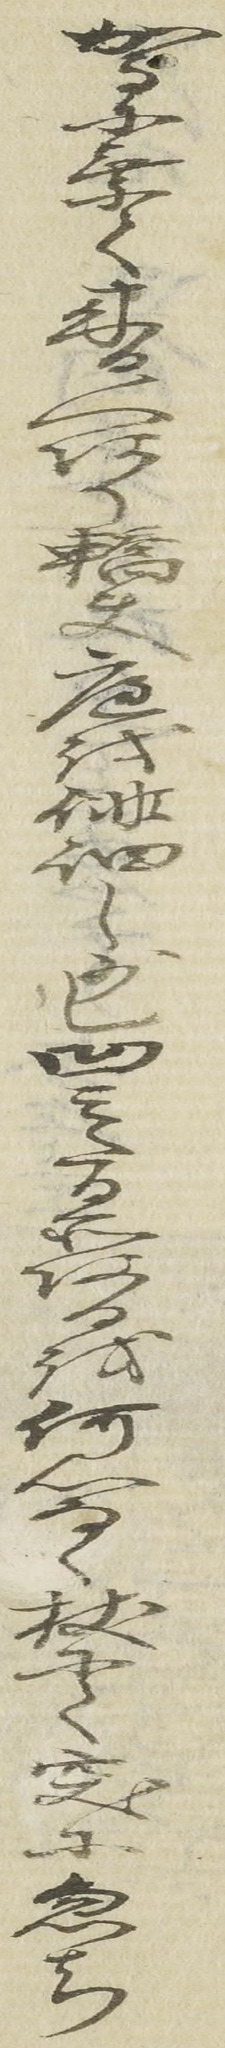駕に乗て来る人あり轎夫庭を徘徊し少し凹ミたる所あるを何心なく杖にて突に忽ち
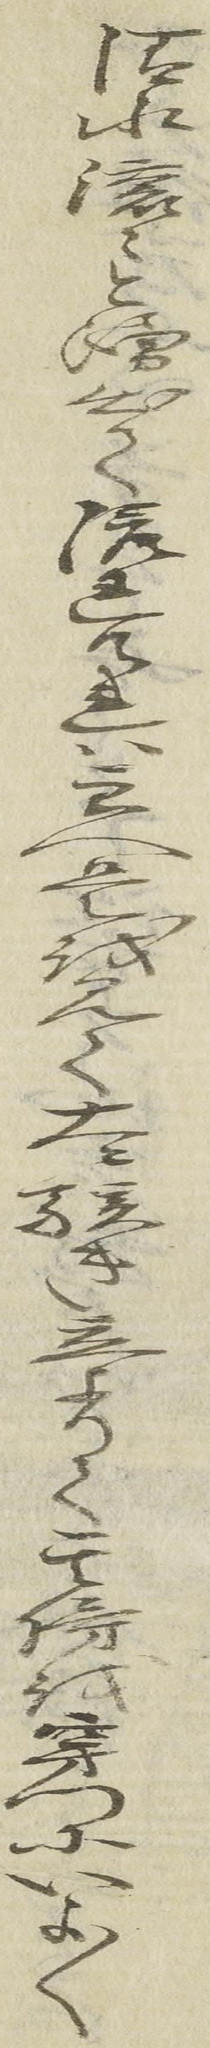清水滾〻と湧出て流れケれハ主人是を見て大ニ駭き立よりて其傍を穿つにいよ〳〵
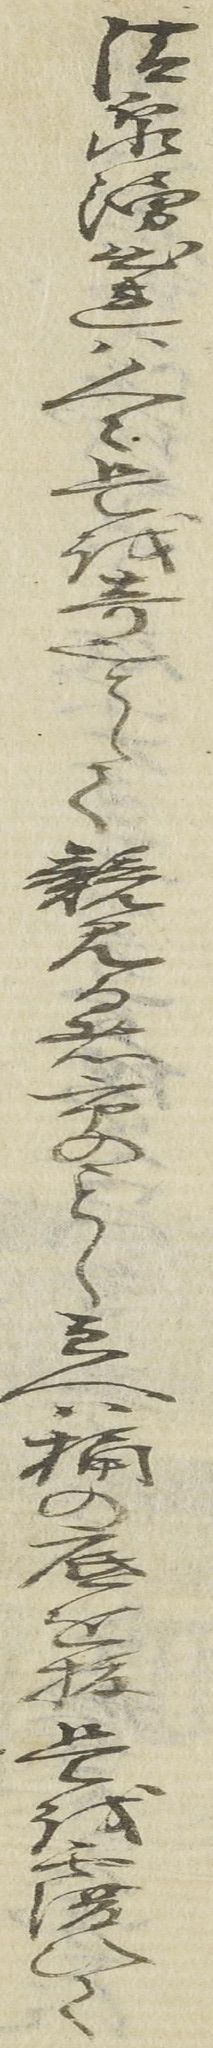清泉湧出れハ人〻是を奇也として疑見る者市のことく主人ハ桶の底を抜是を覆ひて
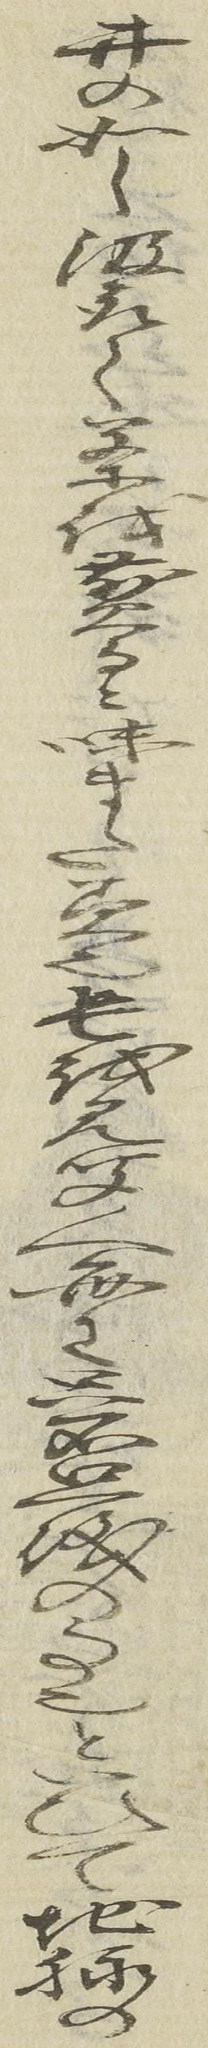井の如し汲取て茶を煎ると味また異也是を見聞人毎に只不思儀の事也といひて地脈の
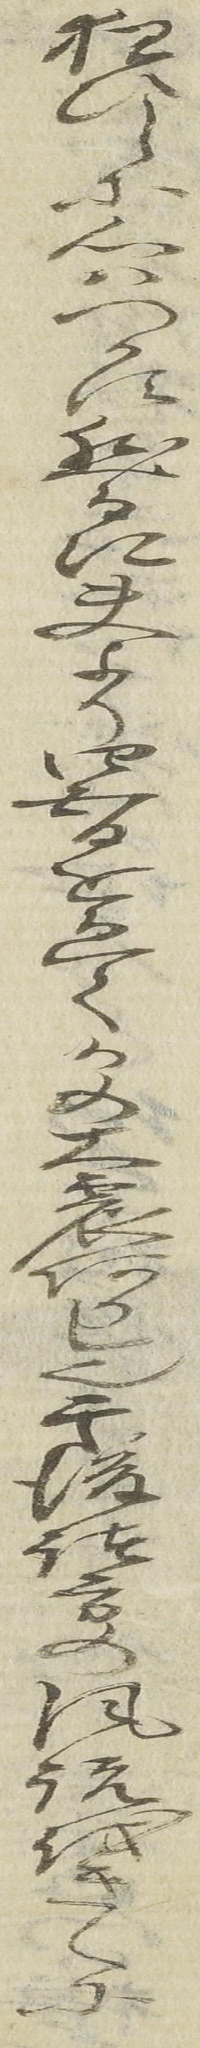狂ひしに心ハつかす然るに夫より四五日を過てかの大震ありし也其後諸方の風説をきくに
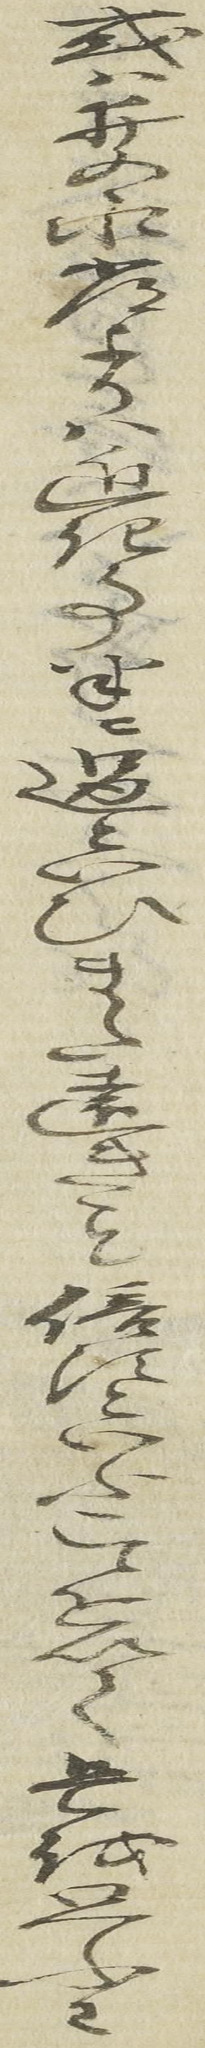或ハ井の水常よりハ近き事半ニ過といひまた遠きこと倍すといふこゝを以て是を思ふに
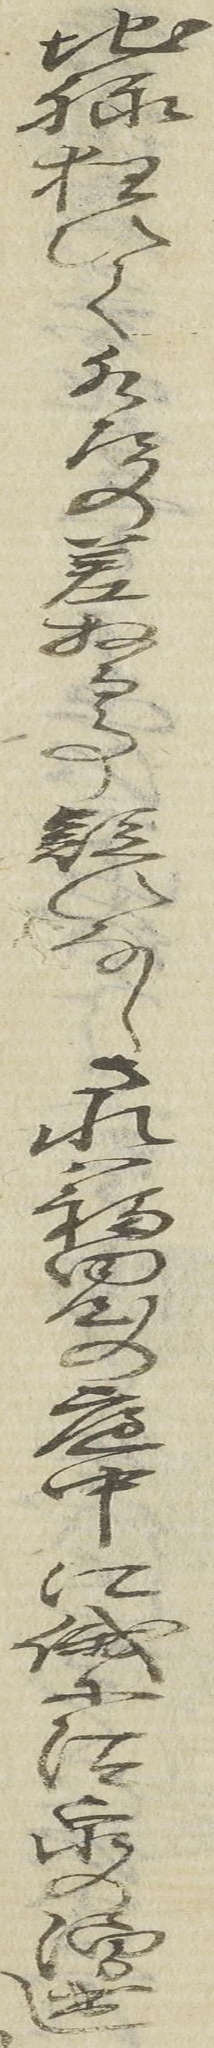地脈狂ひて水道の差？る事疑ひなしされハ福田屋の庭中に俄に清泉の湧出しも

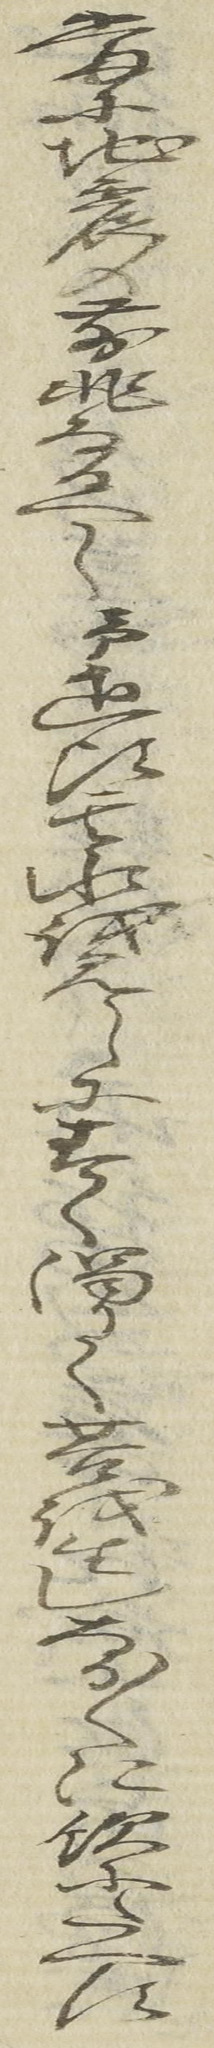當に地震の前兆なるへし予近頃其水を見しに青く濁りて苔を生しなか〳〵に飲にたへす
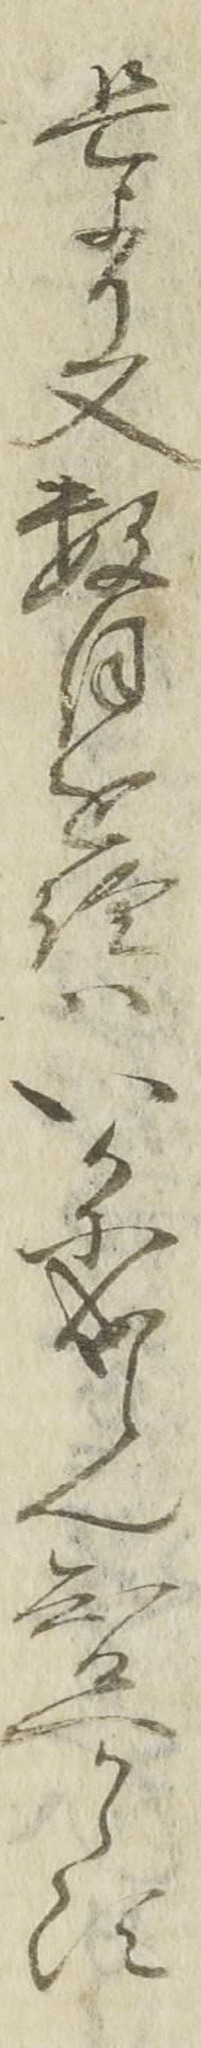是より又数日を経ハいかに成らん知るへからす
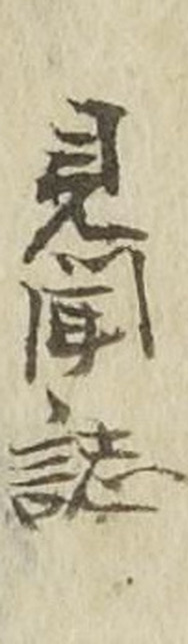見聞誌
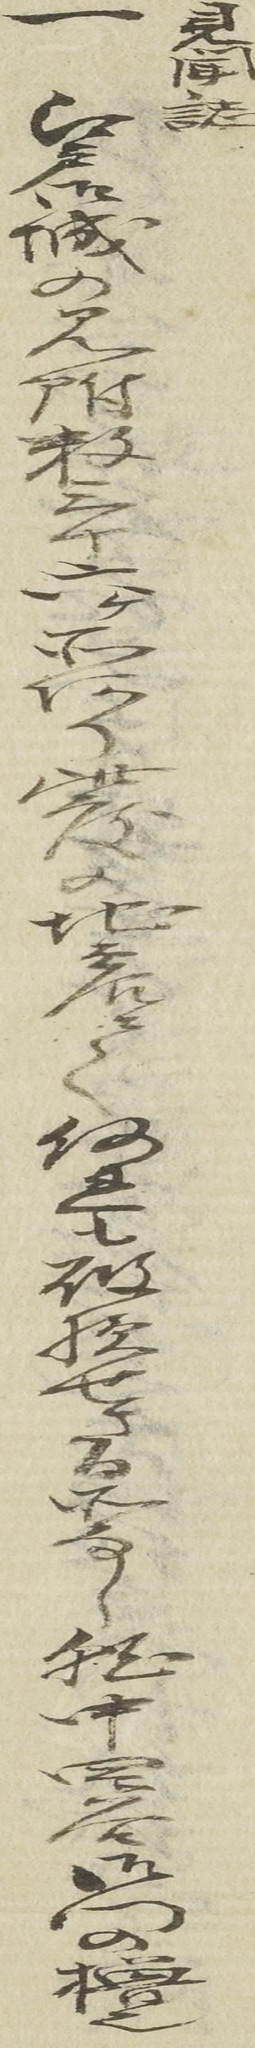一江戸御城の見附数三十六ケ所あり此度の地震ニて何れも破損せさる所なし就中四ツ谷御門の櫓之
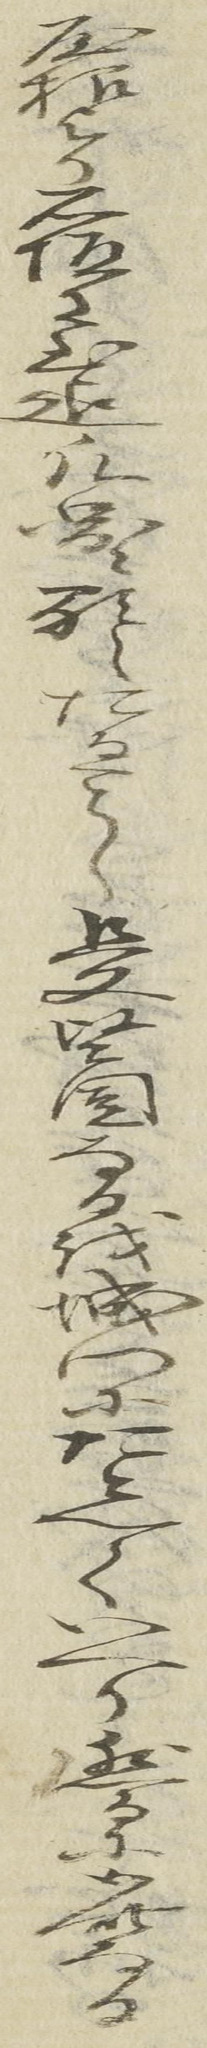屋根より石垣に至迄凡図ニ顕したることく且又堅固なるを城門にたとへていへり然るに如此なる
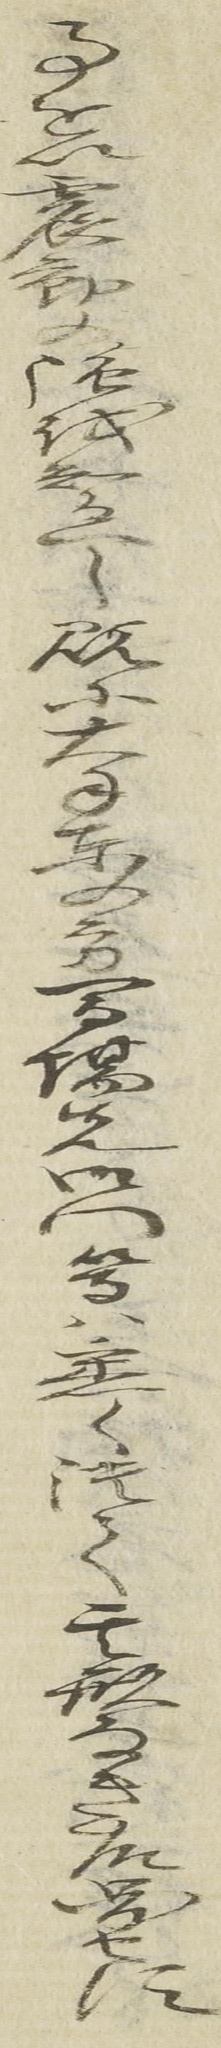事を以震動の強を知るへし既に大手東の方馬場先御門等ハ悉く潰て其形なき故図セす
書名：安政乙卯江戸大地震筆記　安政丙辰八月大阪大雷雨之記追加　安政三辰年七月松前辺大地震并八月大風雨記録
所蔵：東京大学地震研究所図書室 Earthquake Research Institute Library, The University of Tokyo, JAPAN
